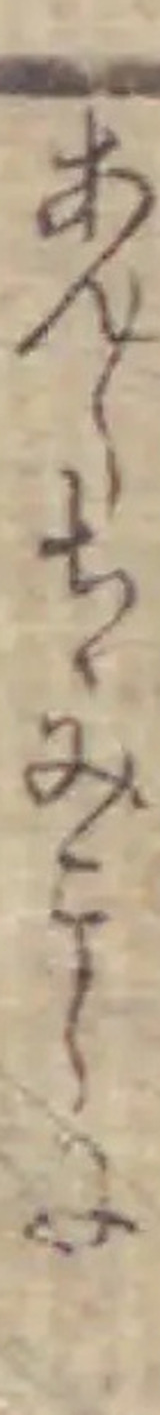あんしちゝみこしに
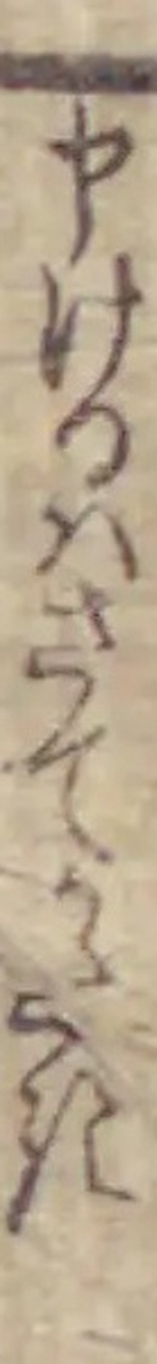申けるはさてかたき
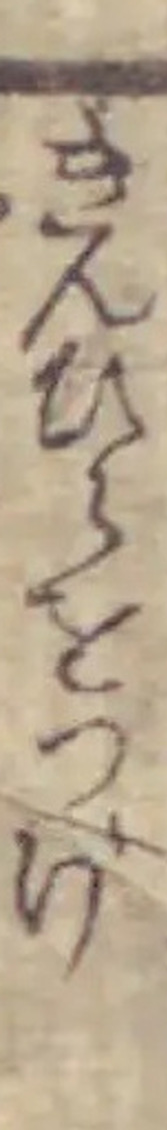きんひらをつけ
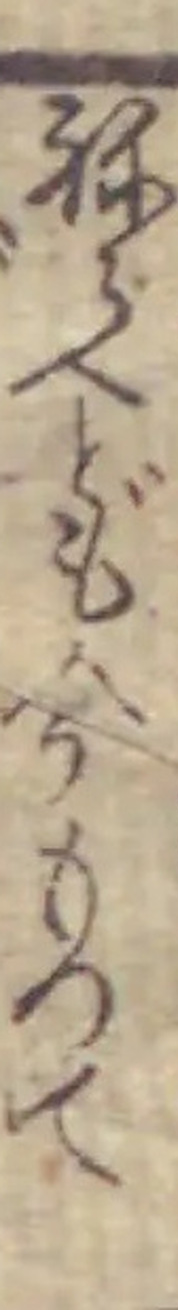ねらへども今もつて
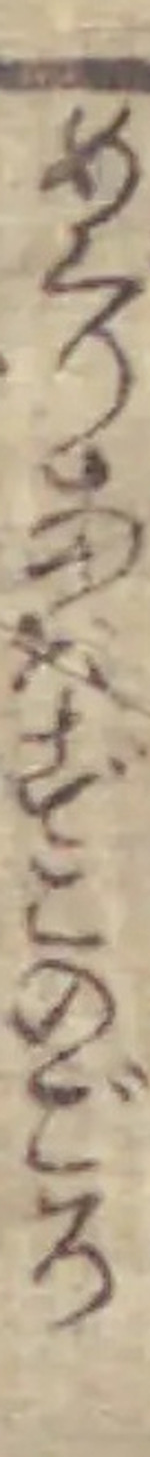めぐりあはずこのごろ
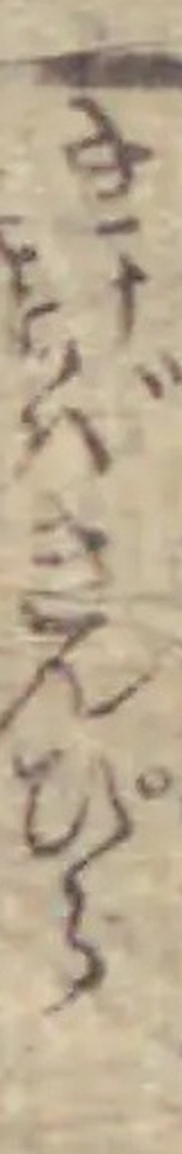きけばきんぴら
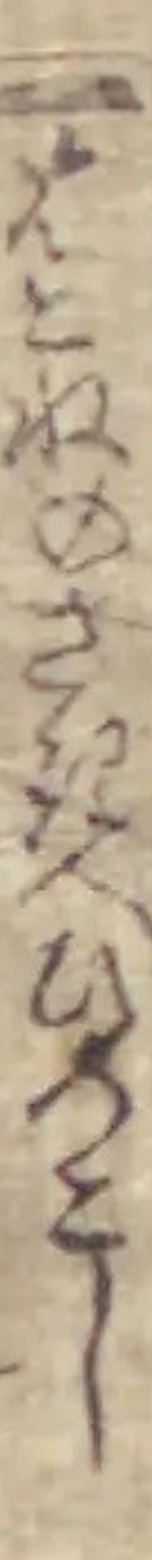はこねのさきへひつこし
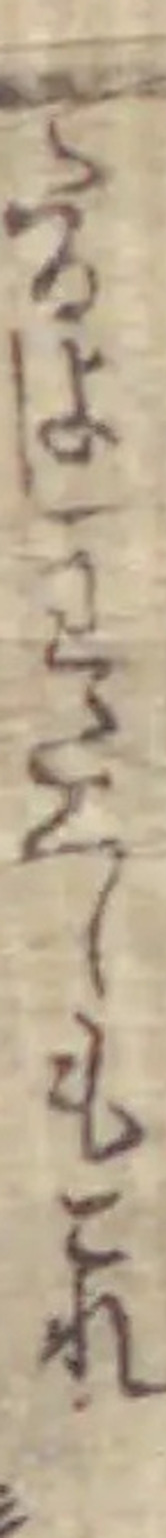たるよしわたくしもこれ
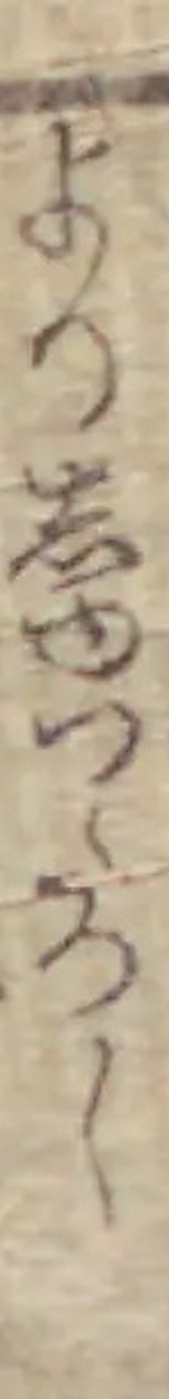よりしゆつたつし
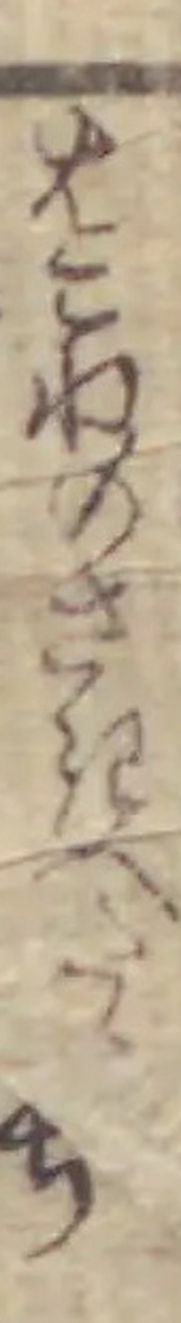はこねのさきへたち
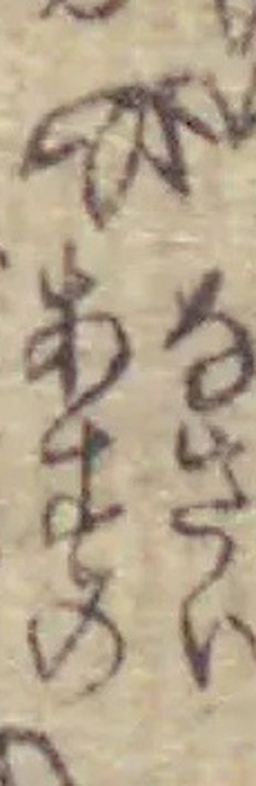あすの
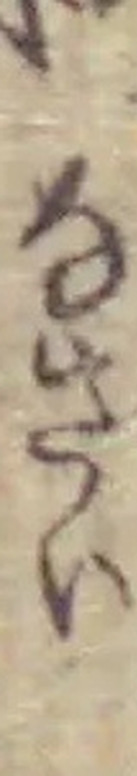なさい
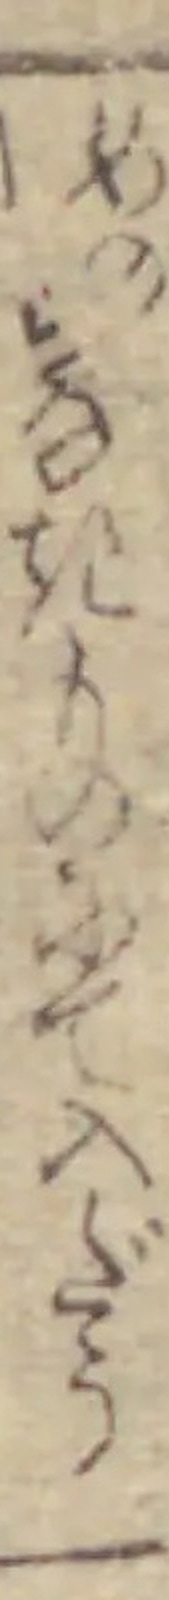めのなきものにて入だう
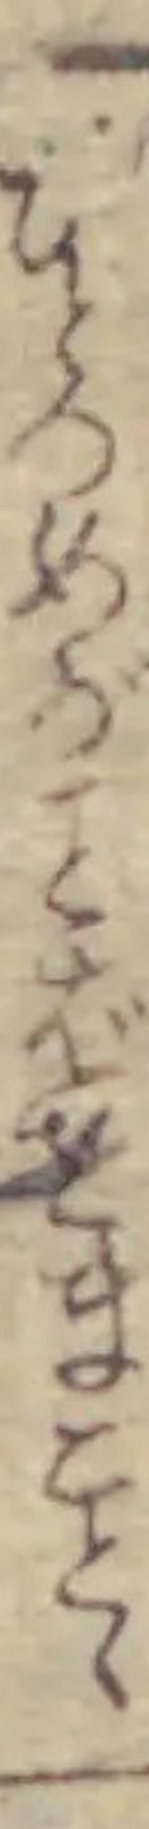ひとつめがことばをまことゝ
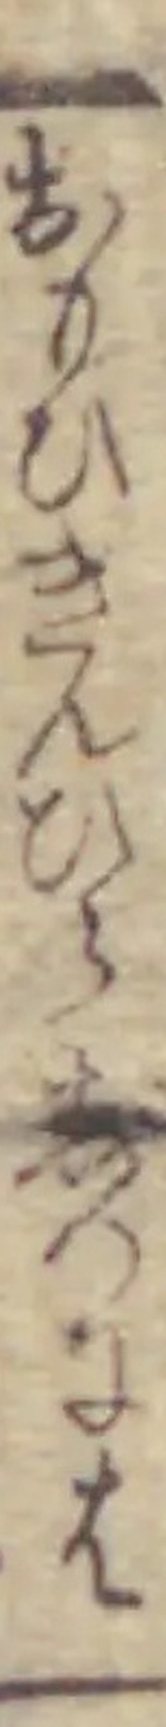いもひきんひらじつには
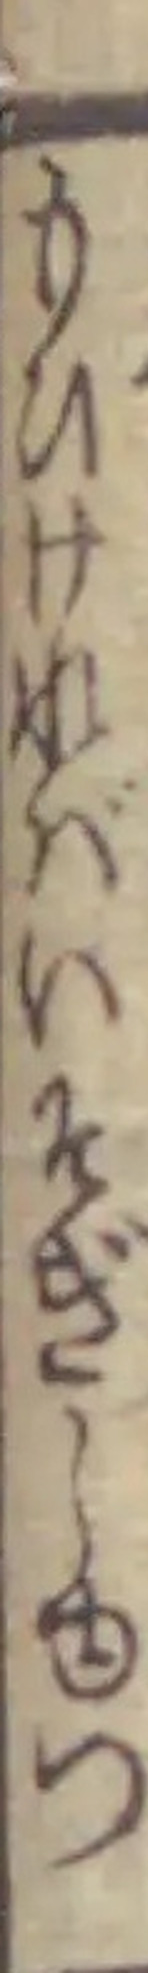ひければいそぎしゆつ
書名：化物敵討 2巻
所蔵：国立国会図書館 National Diet Library, JAPAN
